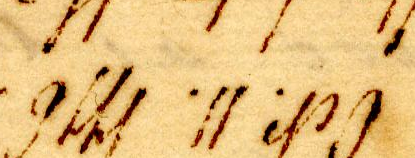Oct^r. 11. 1776.
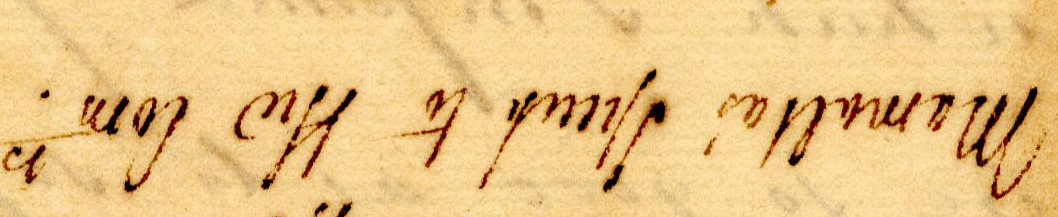Mamalta's Speech to the Com^r.
